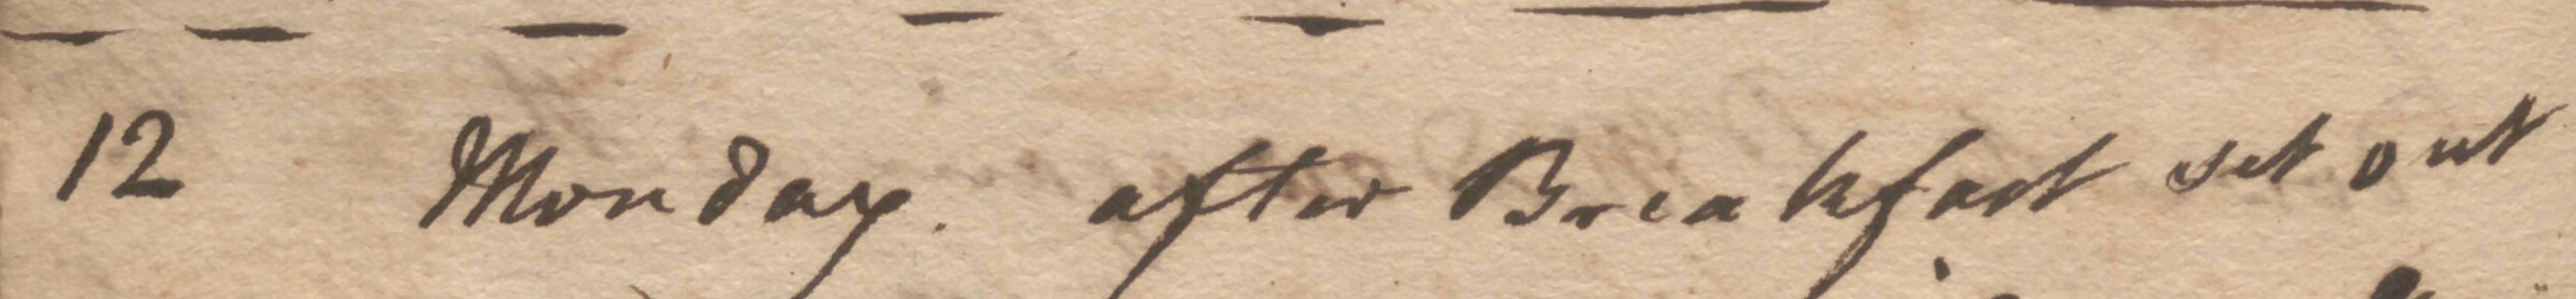12 Monday. after Breakfast set out
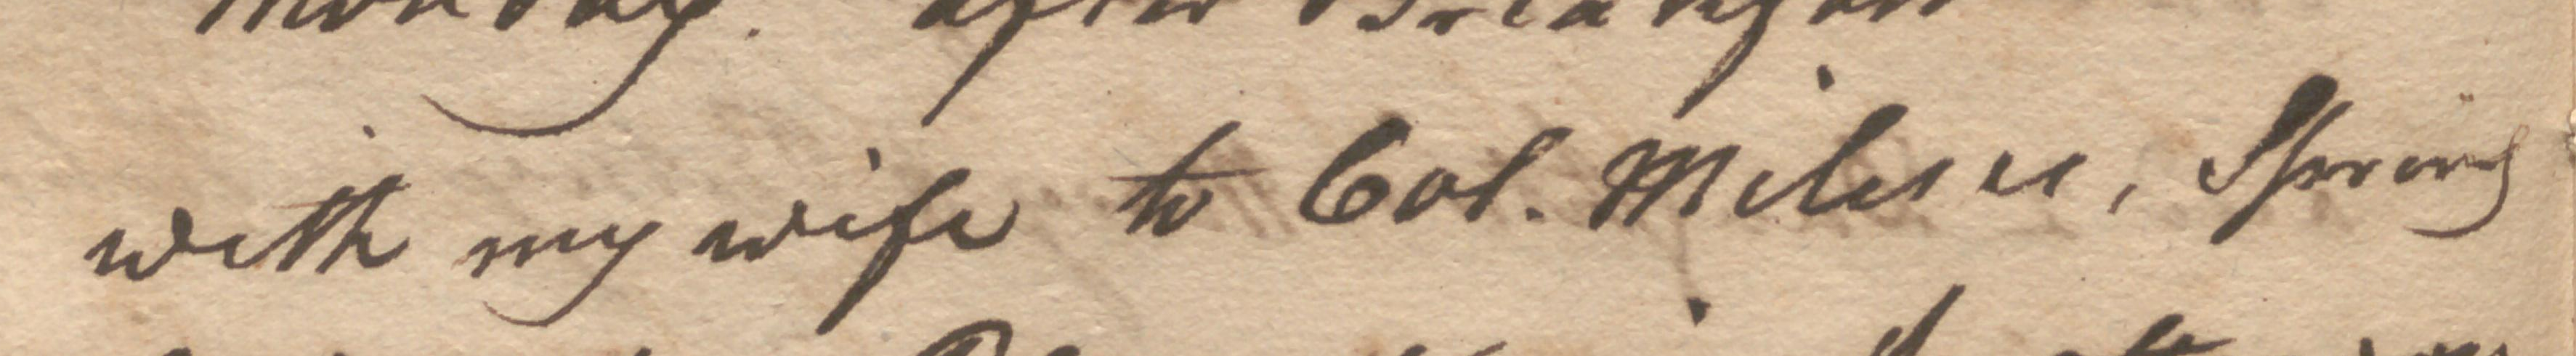with my wife to Col. Mileses, Spring
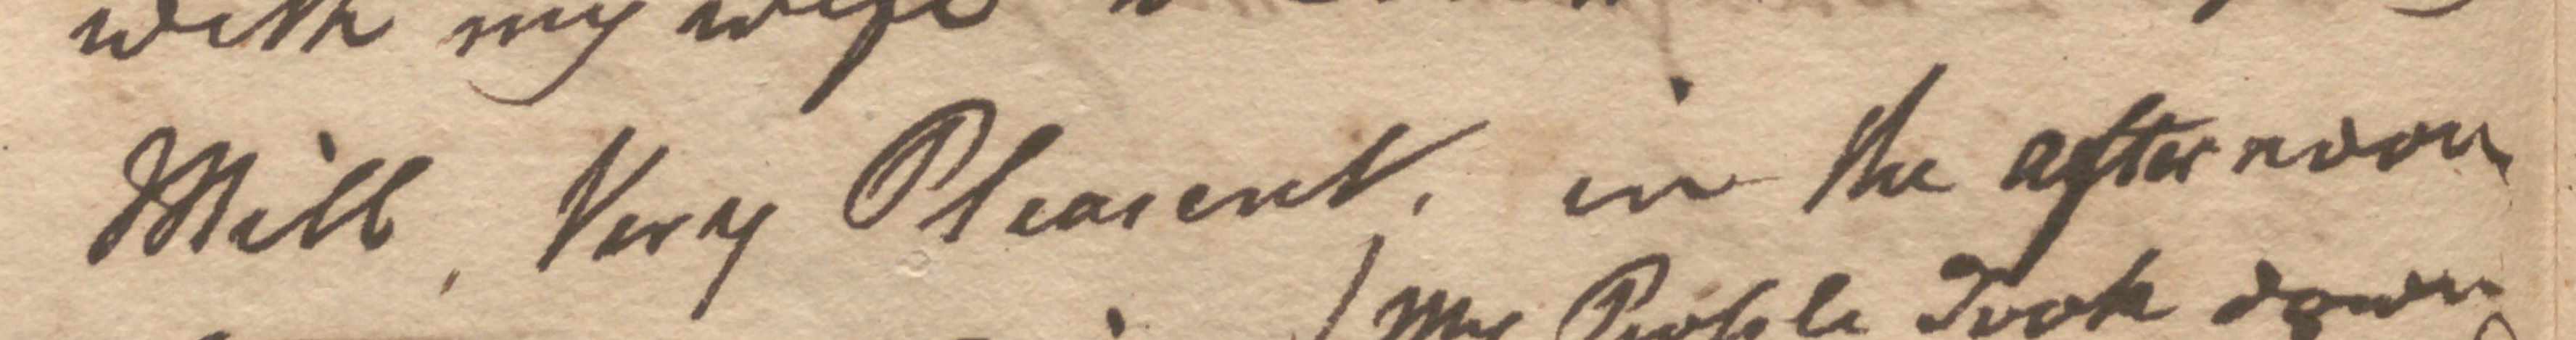Mill Very Pleasent. in the afternoon
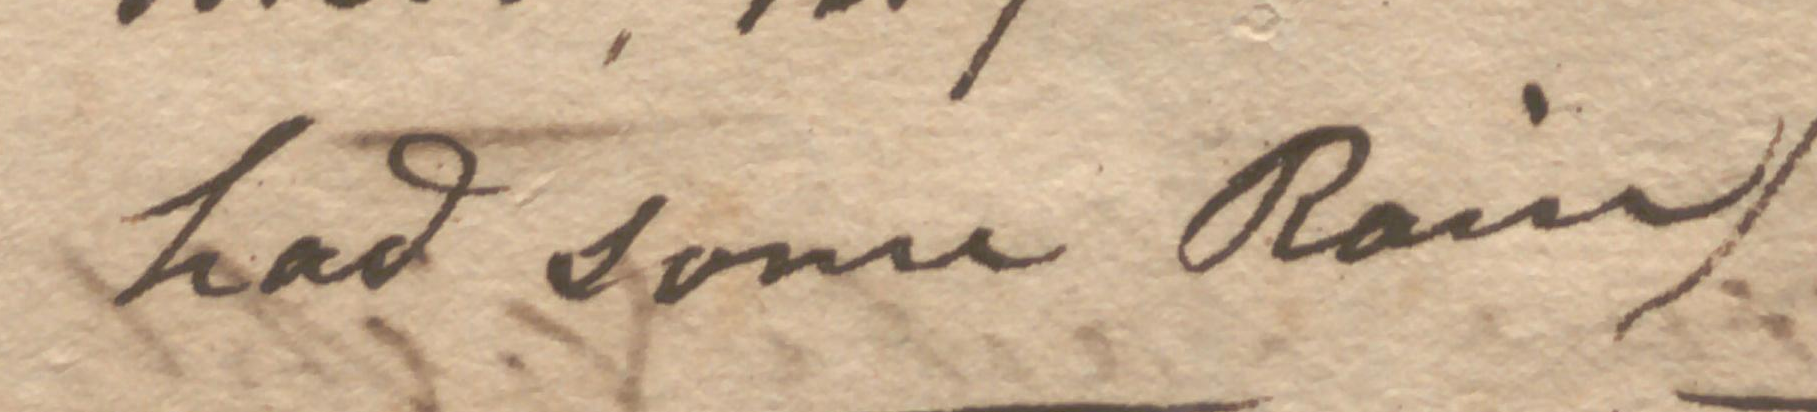had some Rain
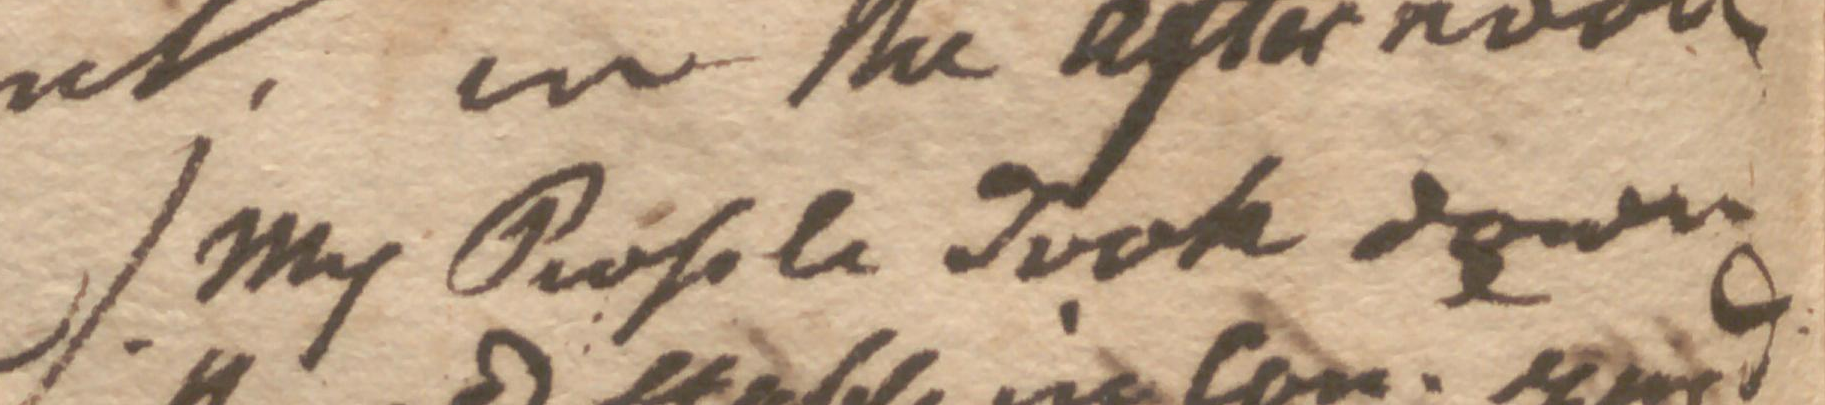My People Took down
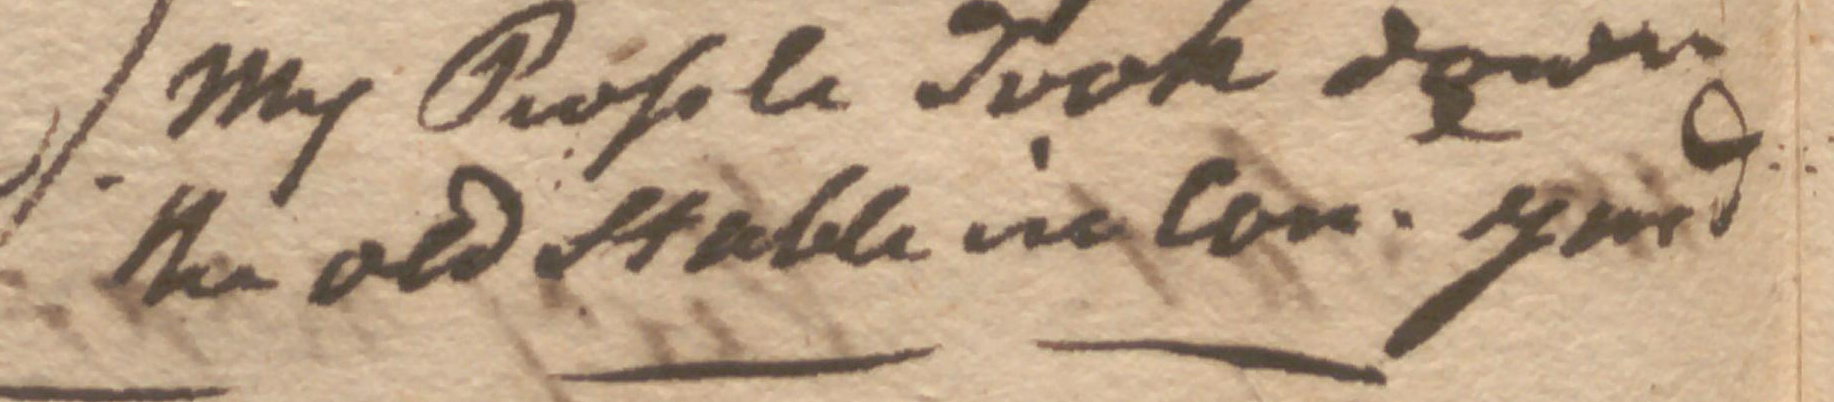the old Stable in Con^l. yard
